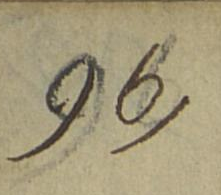96
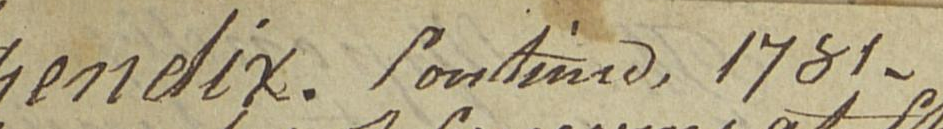Apendix. Continued, 1781.
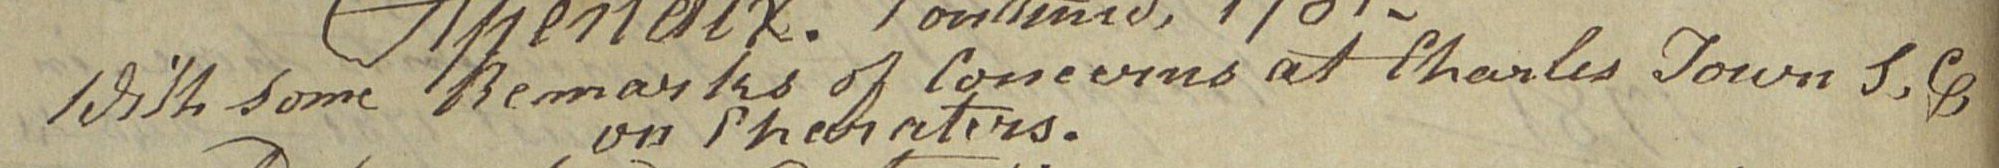With some Remarks of Concerns at Charles Town S.C.
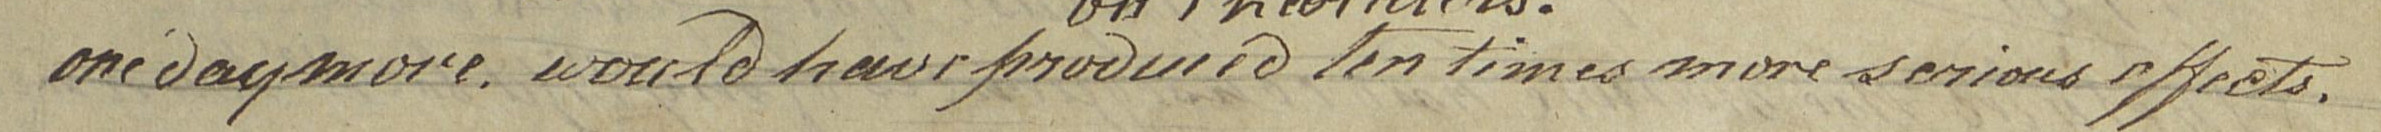one day more. would have produced ten times more serious effects.
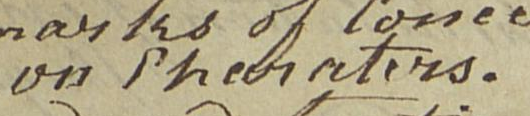on Characters.
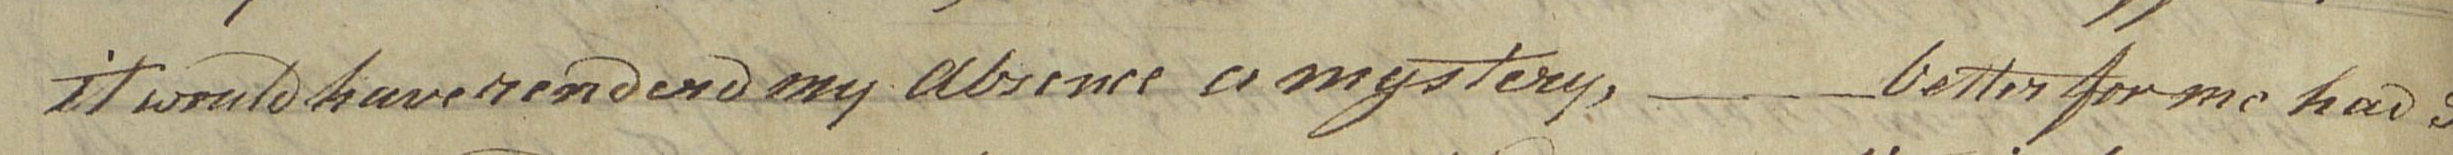it would have rendered ny Absence a mystery, better for me had I
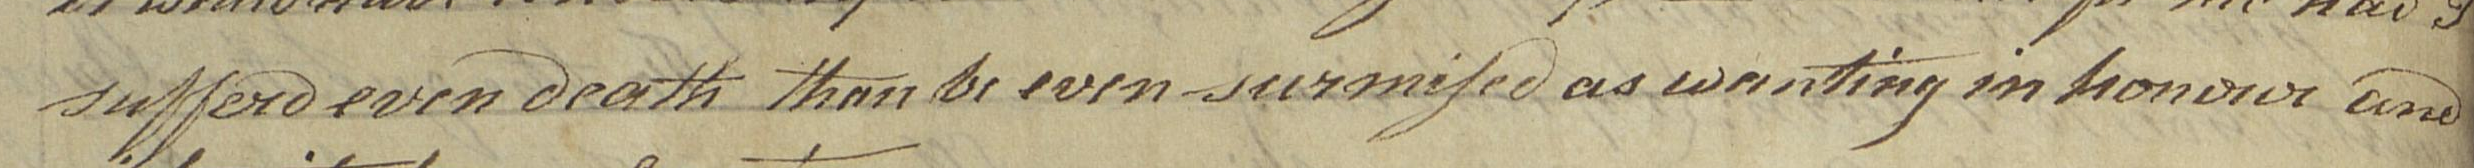sufferd even death than be even surmised as wanting in honour and
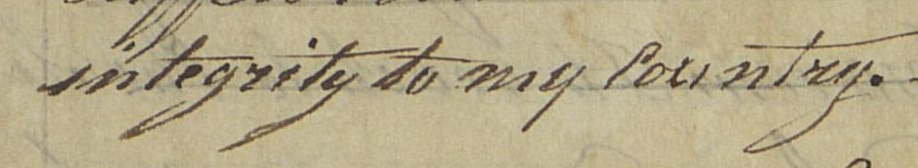integrity to my Country.
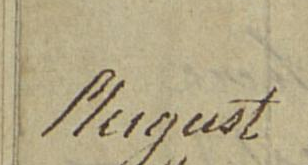August
